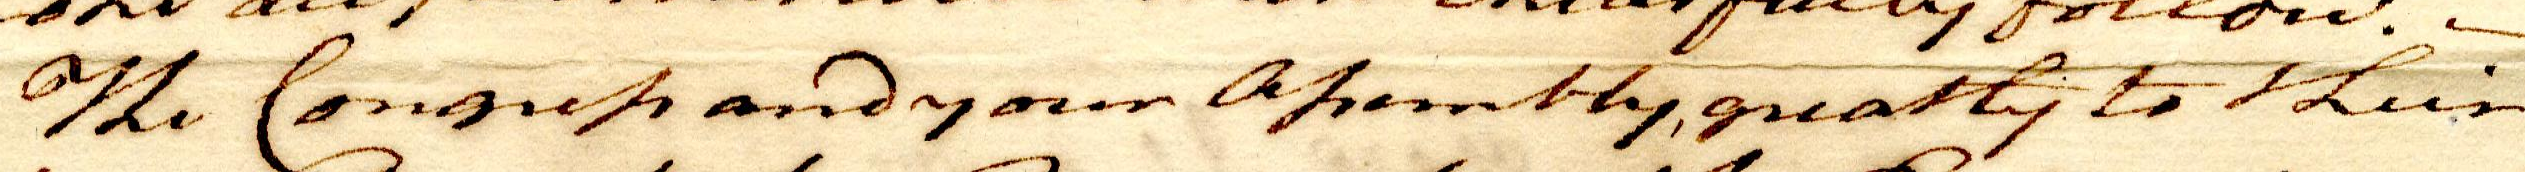The Congress and your Assembly, greatly to their
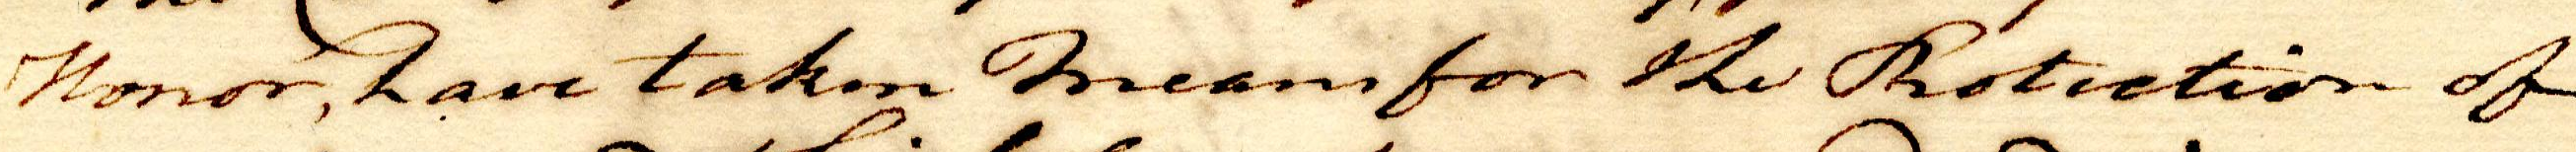Honor, have taken means for the Protection of
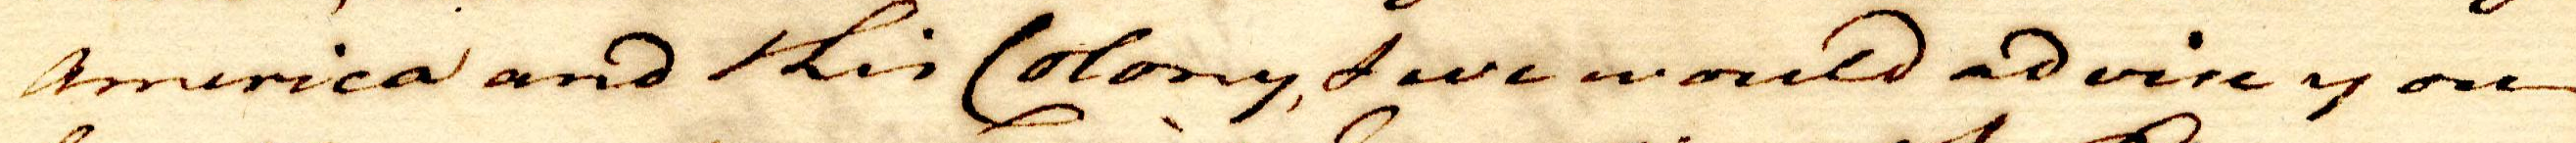America and this Colony, & we would advise you
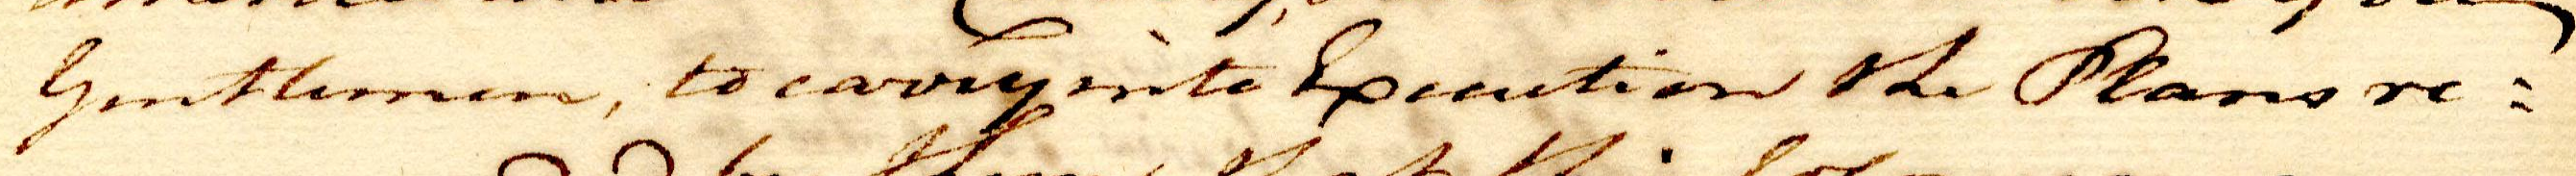Gentlemen, to carry into Execution the Plans re-
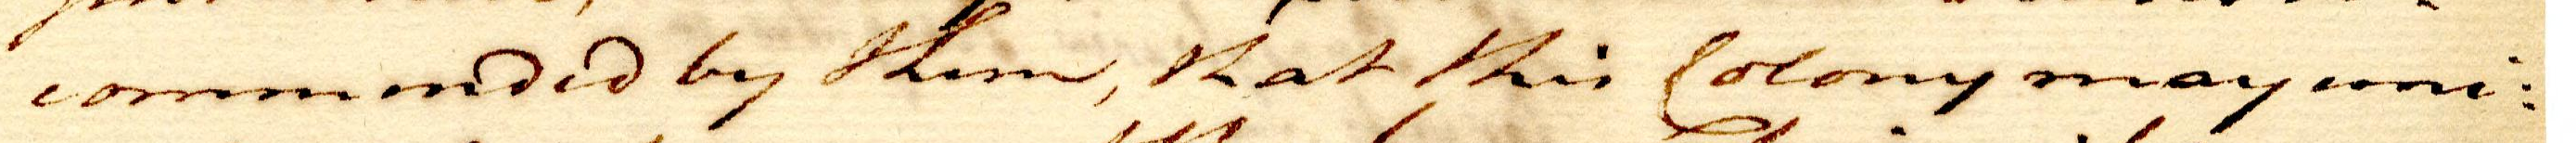commended by them, that this Colony may uni-
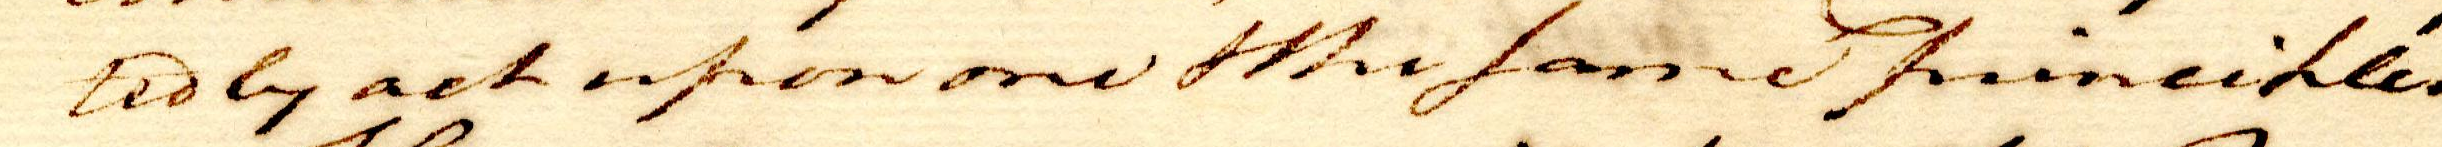tedly act upon one & the Same principle
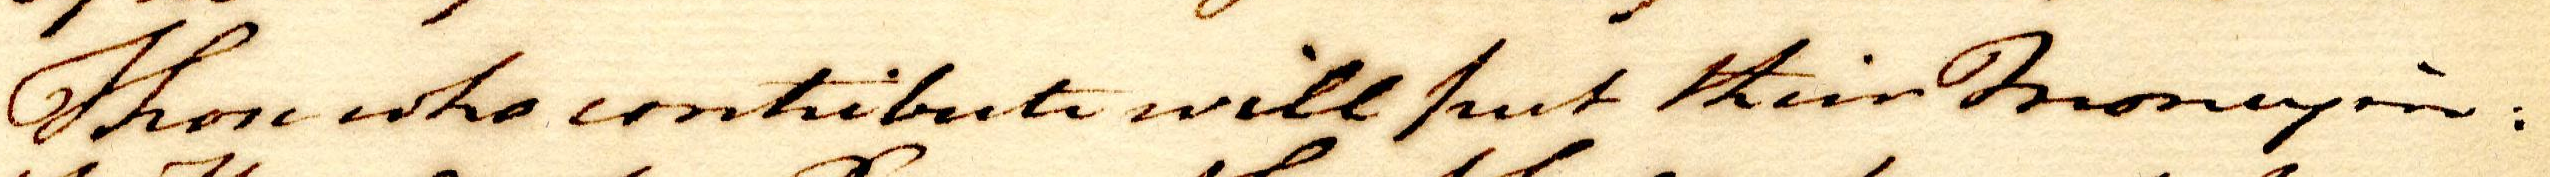Those who contribute will put their Money in
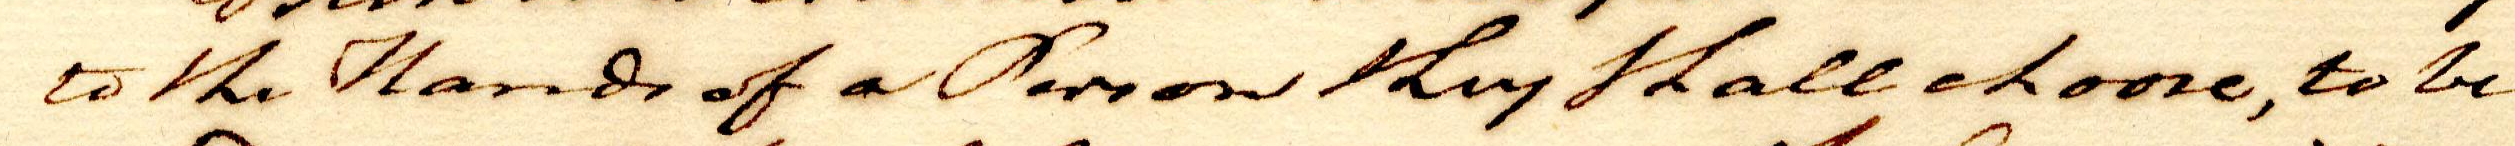to the Hands of a Person they shall choose, to be
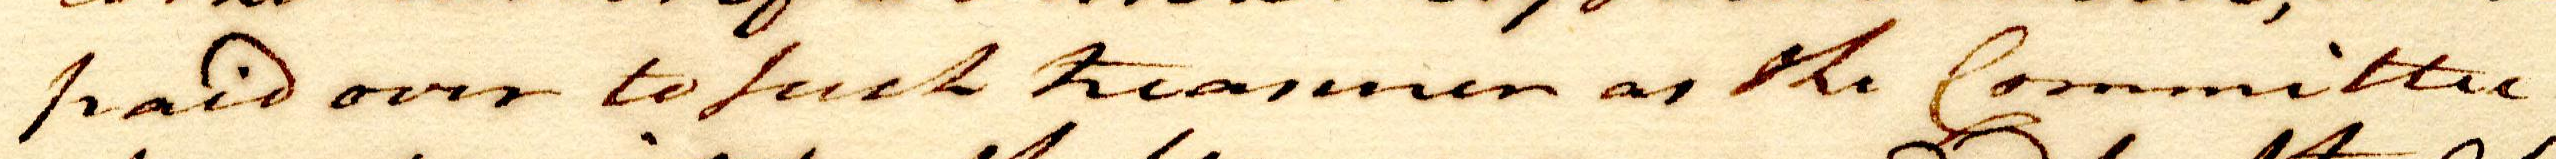paid over to such treasurer as the Committee
